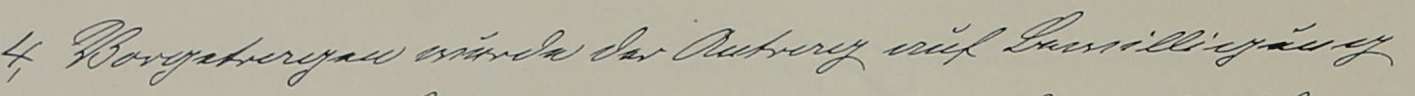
4. Vorgetragen wurde der Antrag auf Bewilligung
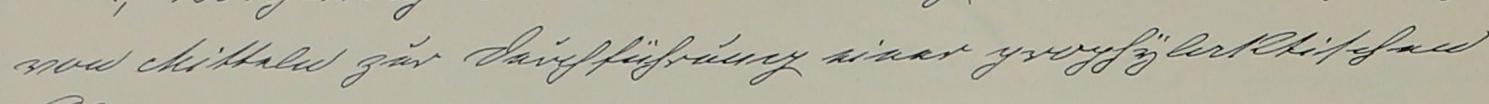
von Mitteln zur Durchführung einer prophylaktischen
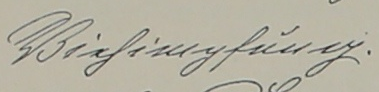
Viehimpfung.
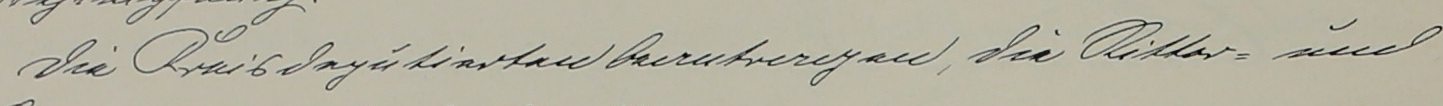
Die Kreisdeputierten beantragen, die Ritter- und
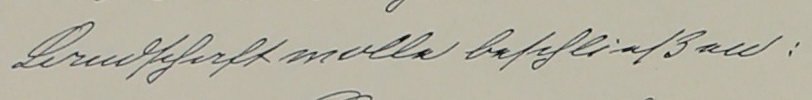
Landschaft wolle beschließen:
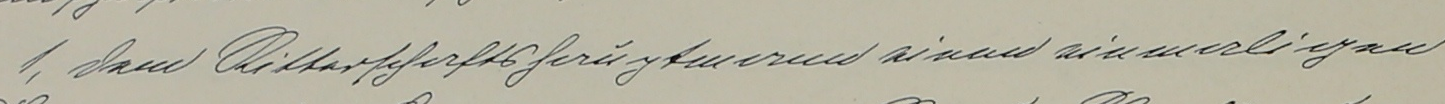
1. Dem Ritterschaftshauptmann einen einmaligen
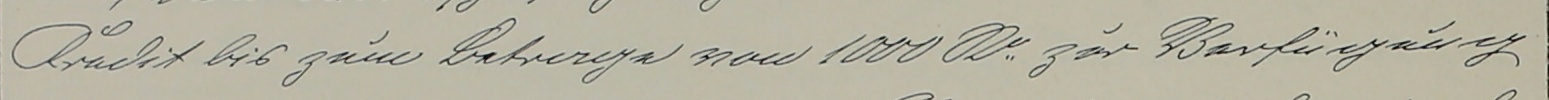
Kredit bis zum Betrage von 1000 Ro. zur Verfügung
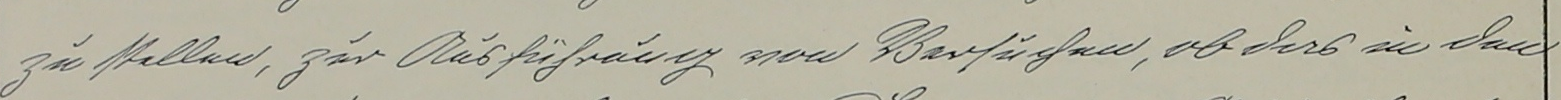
zu stellen, zur Ausführung von Versuchen, ob das in den
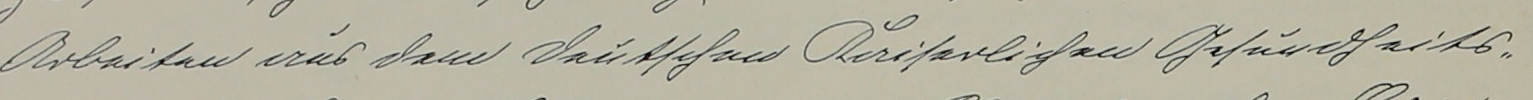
Arbeiten aus dem Deutschen Kaiserlichen Gesundheits-
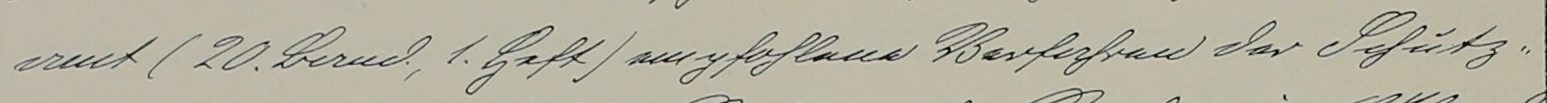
amt (20. Band, 1. Heft) empfohlene Verfahren der Schutz-
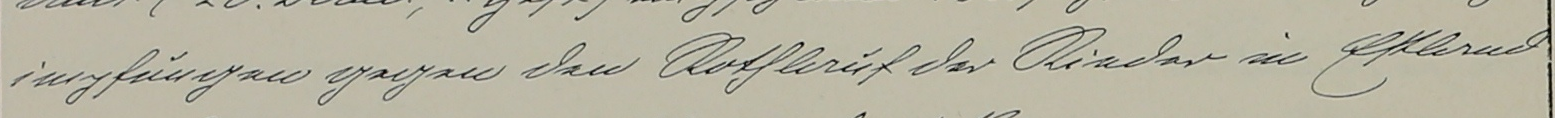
impfung gegen den Rothlauf der Rinder in Estland
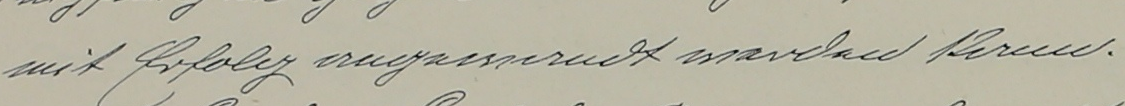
mit Erfolg angewandt werden kann.
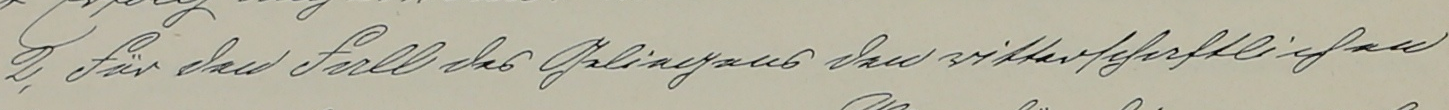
2. Für den Fall des Gelingens den ritterschaftlichen
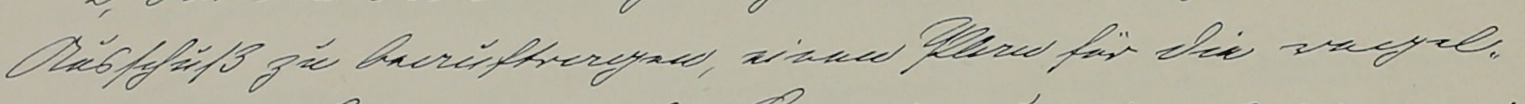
Ausschuß zu beauftragen, einen Plan für die regel-
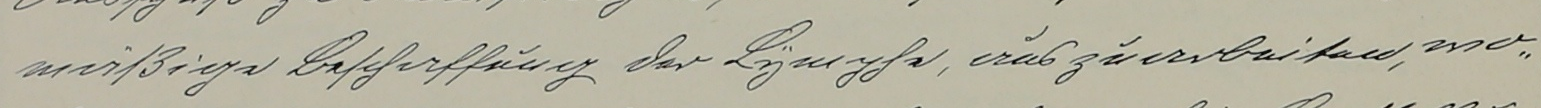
mäßige Beschaffung der Lymphe auszuarbeiten, wo-
